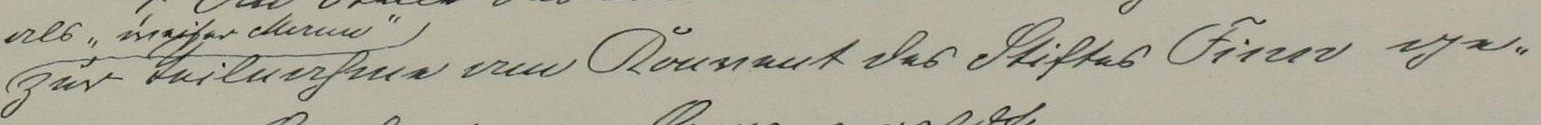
zur Teilnahme am Konvent des Stiftes Finn ge-
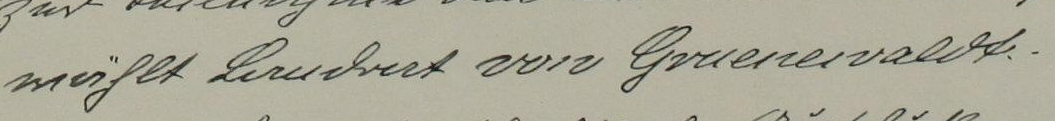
wählt Landrat von Gruenewaldt.
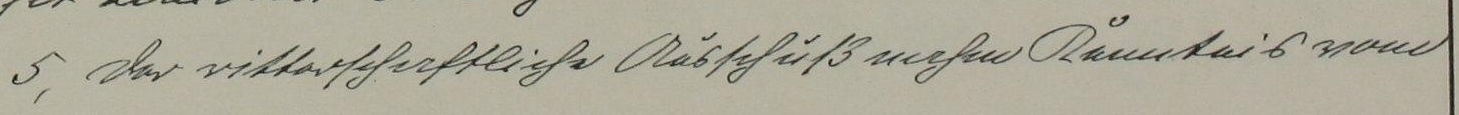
5. Der ritterschaftliche Ausschuß nahm Kenntnis vom
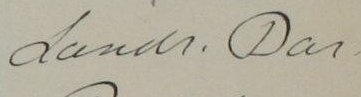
Landr. Bar.
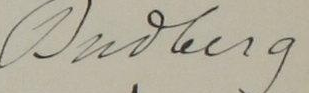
Budberg
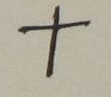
†
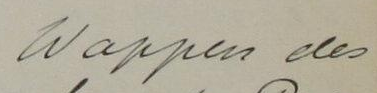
Wappen des
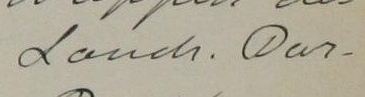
Landr. Bar.
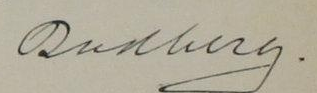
Budberg
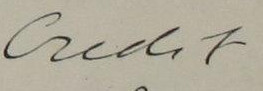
Credit
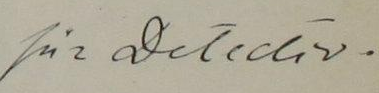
für Detectiv
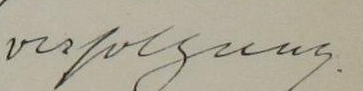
verfolgung.
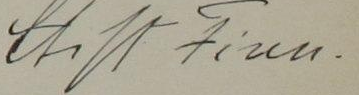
Stift Finn.
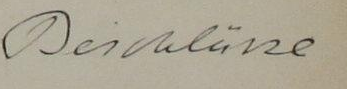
Beschlüsse
